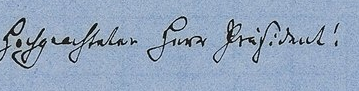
Hochgeachteter Herr Präsident!
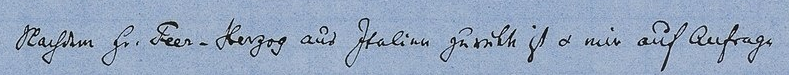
Nachdem Hr. Feer-Herzog aus Italien zurükk ist & mir auf Anfrage
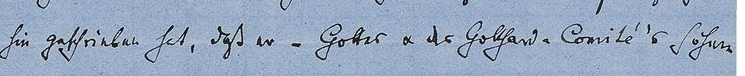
hin geschrieben hat, daß er – Gottes & des Gotthard-Comite's höhere
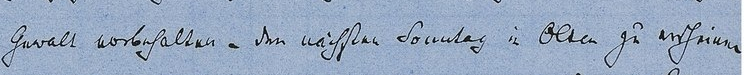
Gewalt vorbehalten – den nächsten Sonntag in Olten zu erscheinen
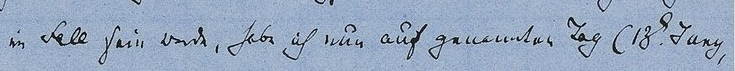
im Fall sein werde, habe ich nun auf genannten Tag ( 13ten Juny,
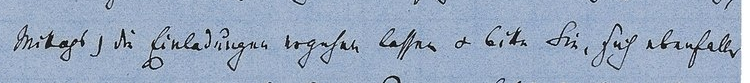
Mittags) die Einladungen ergehen lassen & bitte Sie, sich ebenfalls
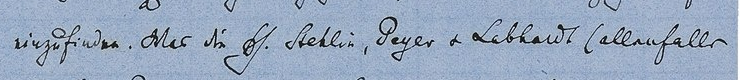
einzufinden. Was die Hh. Stehlin, Peyer & Labhardt (allenfalls
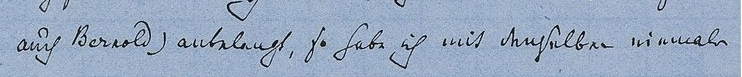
auch Bernold) anbelangt, so habe ich mit denselben niemals
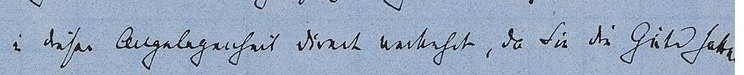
in dieser Angelegenheit direct verkehrt, da Sie die Güte hatten,
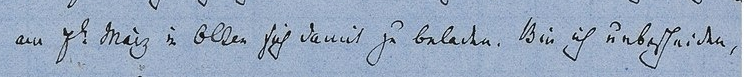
am 7ten März in Olten sich damit zu beladen. Bin ich unbescheiden,
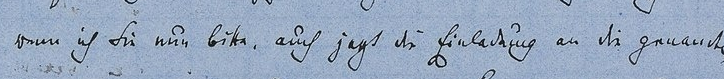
wenn ich Sie nun bitte, auch jezt die Einladung an die genannten
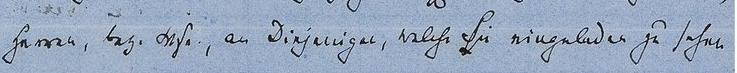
Herren, bez.Wse., an Diejenigen, welche Sie eingeladen zu sehen
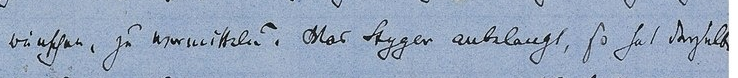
wünschen, zu vermitteln? Was Styger anbelangt, so hat derselbe
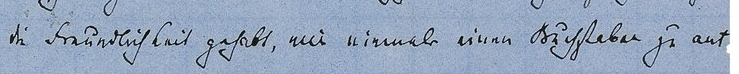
die Freundlichkeit gehabt, mir niemals einen Buchstaben zu ant-
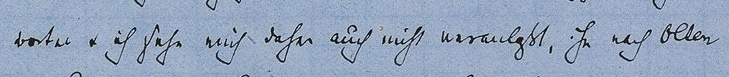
worten & ich sehe mich daher auch nicht veranlaßt, ihn nach Olten
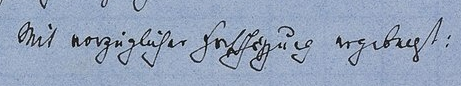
Mit vorzüglicher Hochschätzung ergebenst:
